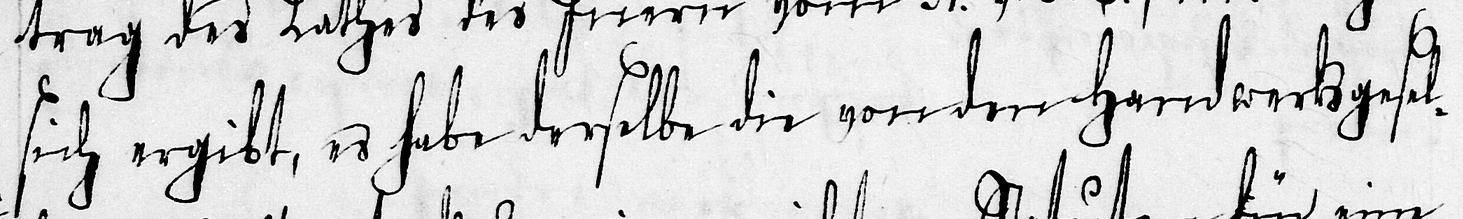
sich ergibt, es habe derselbe die von den Handwerksgesel¬
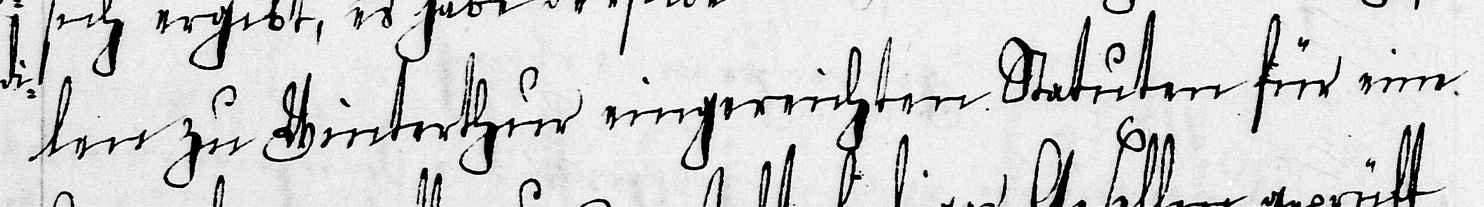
len zu Winterthur eingereichten Statuten für eine
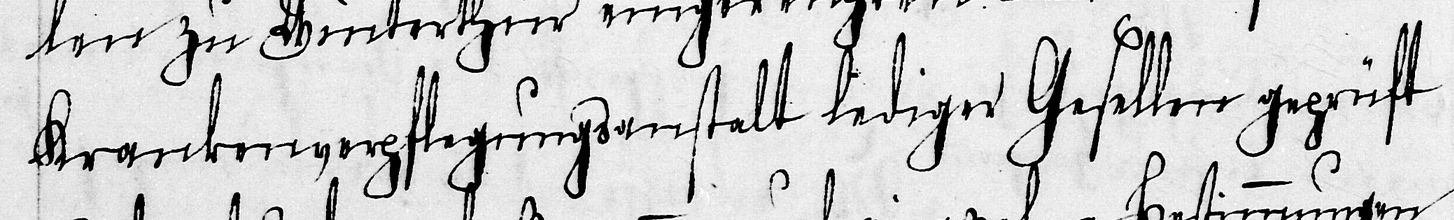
Krankenverpflegungsanstalt lediger Gesellen geprüft
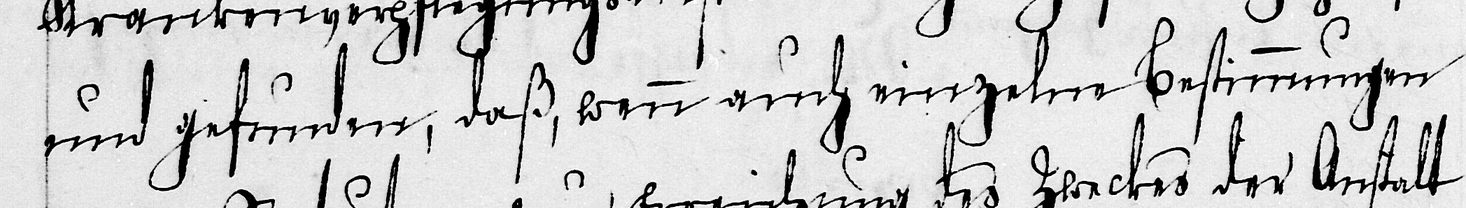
und gefunden, daß, wenn auch einzelne Bestimmungen
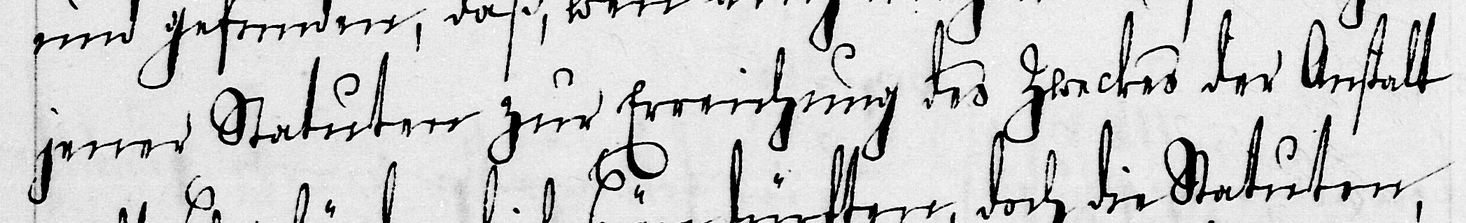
jener Statuten zur Erreichung des Zweckes der Anstalt
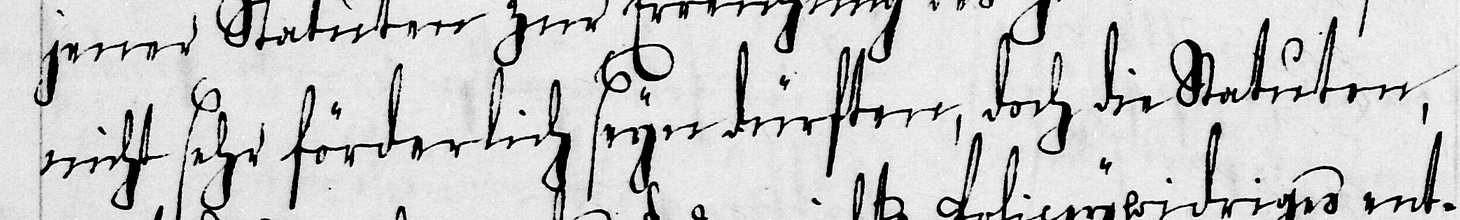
nicht sehr förderlich seyn dürften, doch die Statuten,
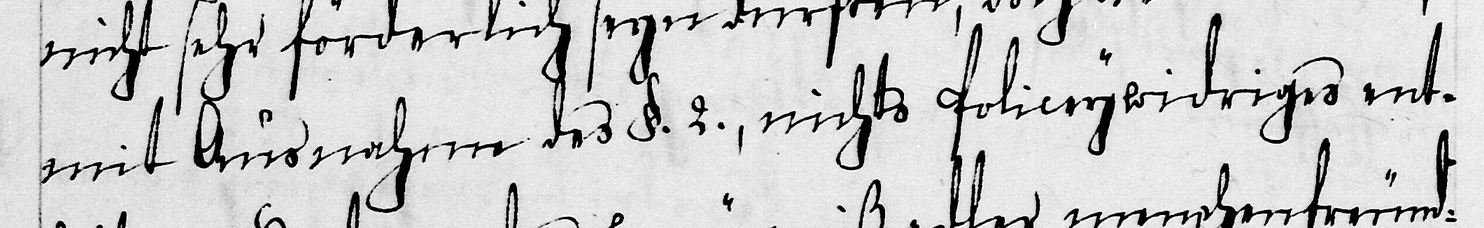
mit Ausnahme des §. 2., nichts Policeywidriges ent¬
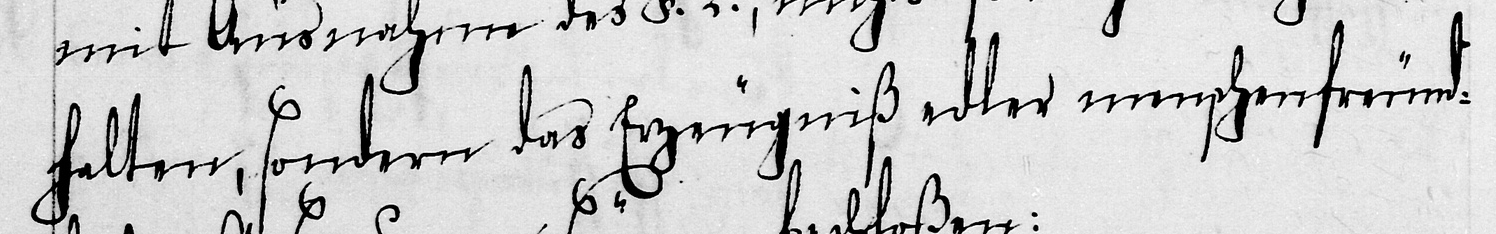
halten, sondern das Erzeugniß edler menschenfreund¬
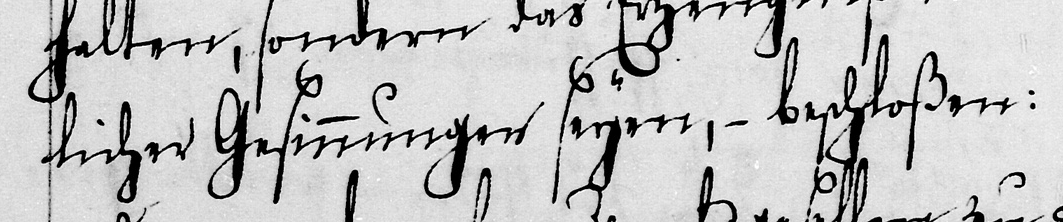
licher Gesinnungen seyen,
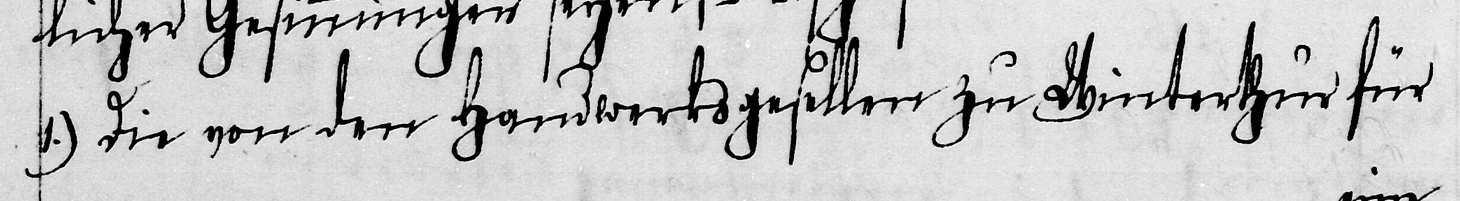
1.) Die von dem Handwerksgesellen zu Winterthur für
